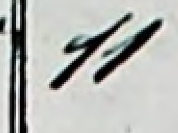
11
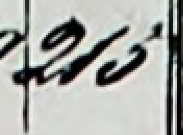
215
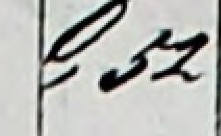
0,52
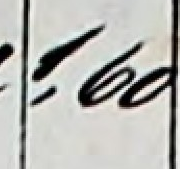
1,60
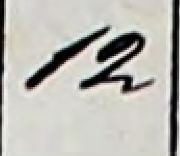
12
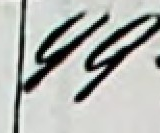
99
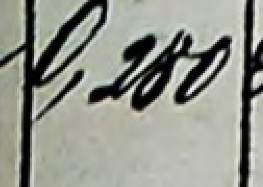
0,280
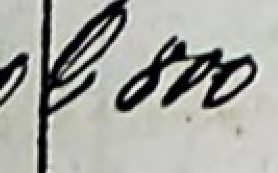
0,800
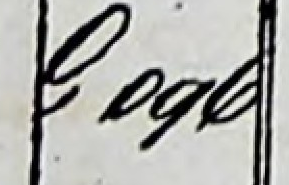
0,096
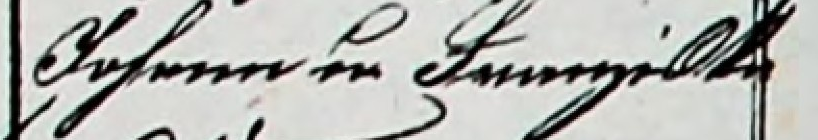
Johann u. Franziska
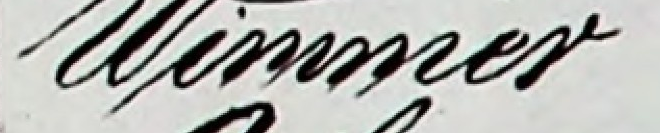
Wimmer
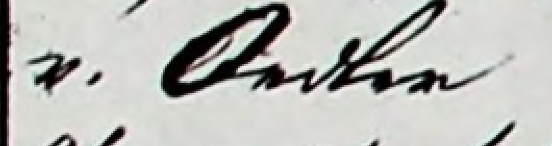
v. Oedler
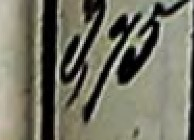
3,75
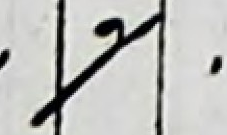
7
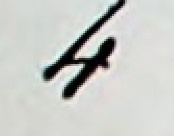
4
